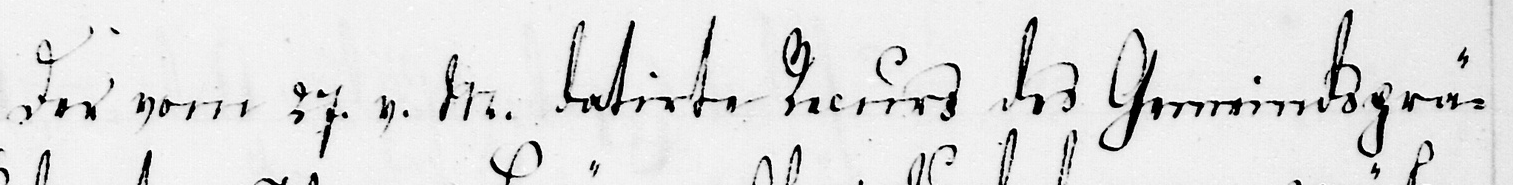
Der vom 27. v. M. datirte Recurs des Gemeindsprä¬
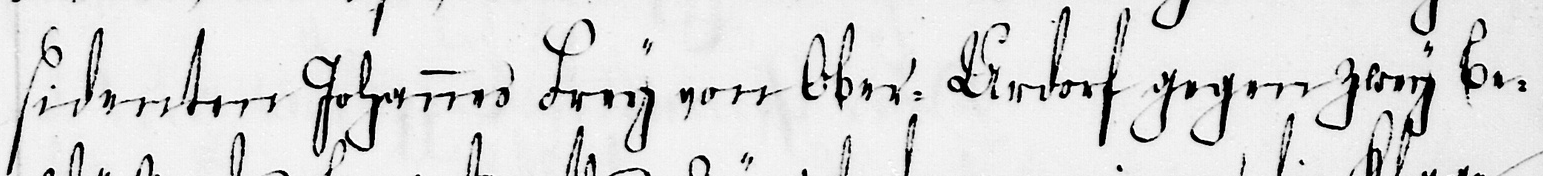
sidenten Johannes Frey von Ober-Urdorf gegen zwey Bes¬
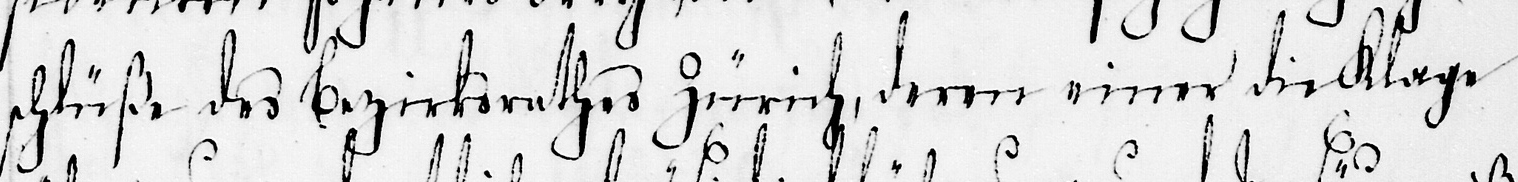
chlüße des Bezirksrathes Zürich, deren einer die Klage
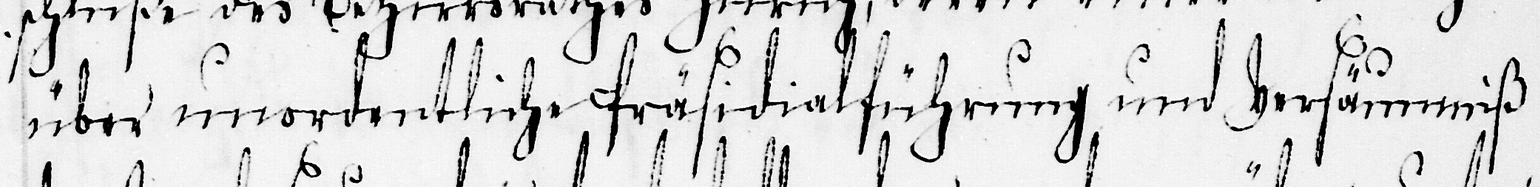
über unordentliche Präsidialführung und Versäumniß
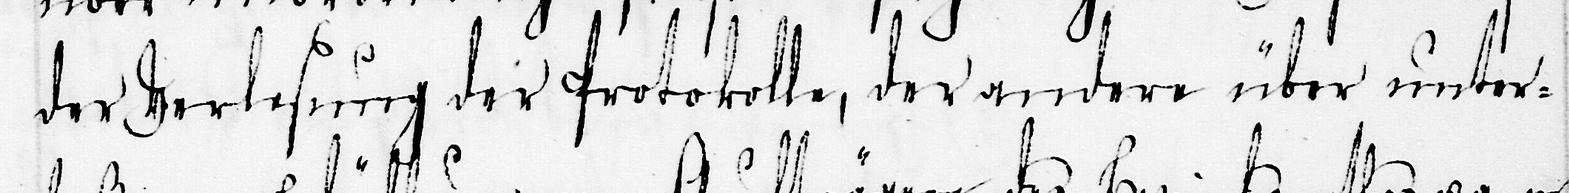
der Verlesung der Protokolle, der andere über unter¬
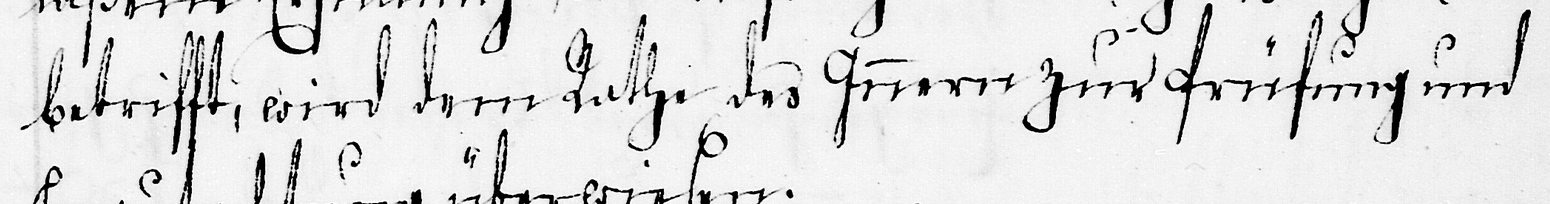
betrifft, wird dem Rathe des Innern zur Prüfung und
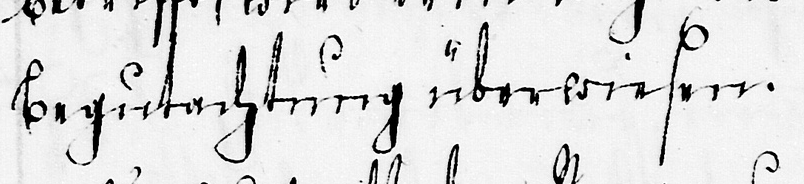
Begutachtung überwiesen.
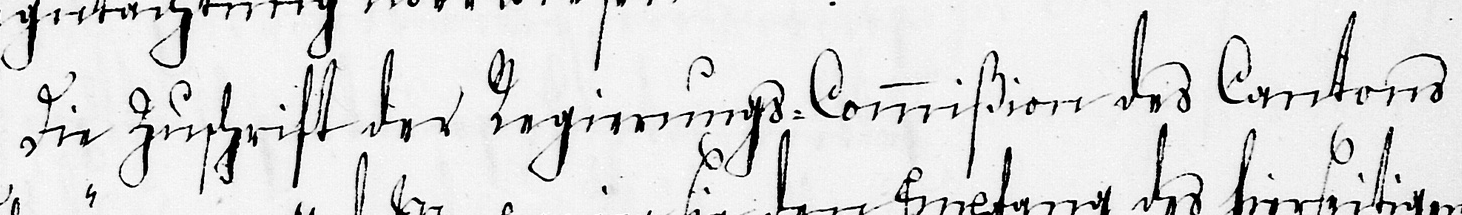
Die Zuschrift der Regierungs-Commißion des Cantons
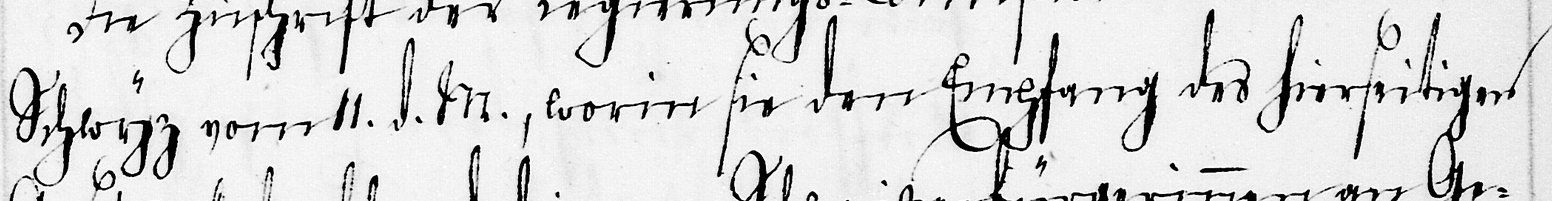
Schwyz vom 11. d. M., worin sie den Empfang des hierseitigen
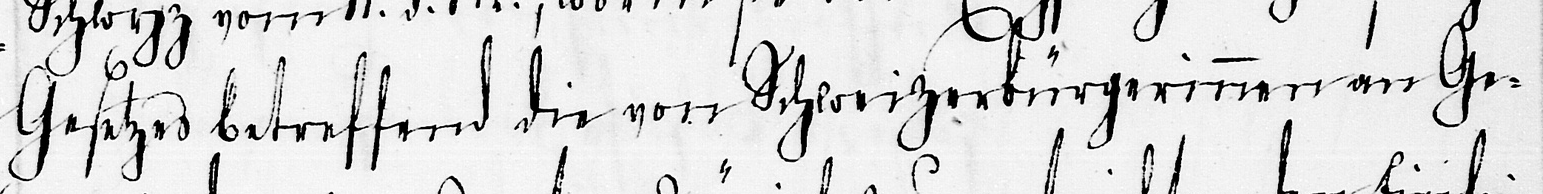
Gesetzes betreffend die von Schweizerbürgerinnen an Ge¬
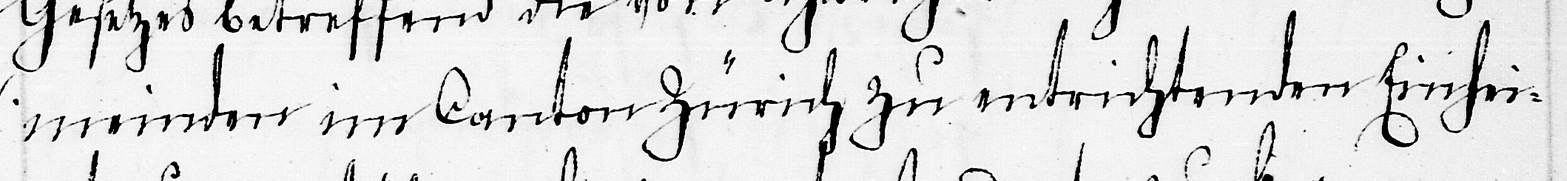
meinden im Canton Zürich zu entrichtenden Einhei¬
